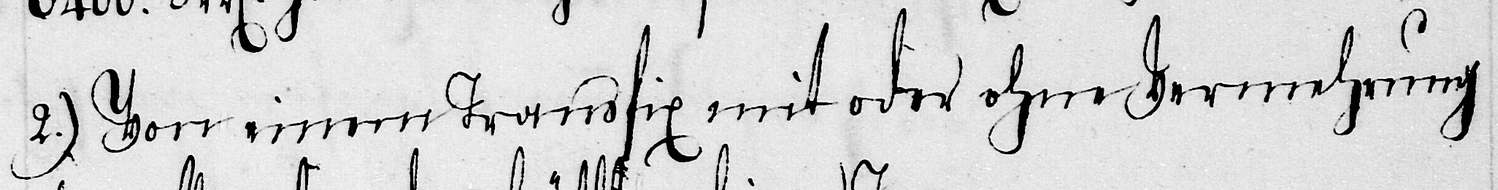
2.) Von einem Transfix mit oder ohne Vermehrung
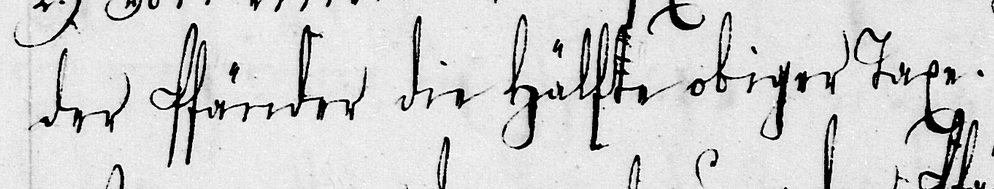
der Pfänder die Hälfte obiger Taxe.
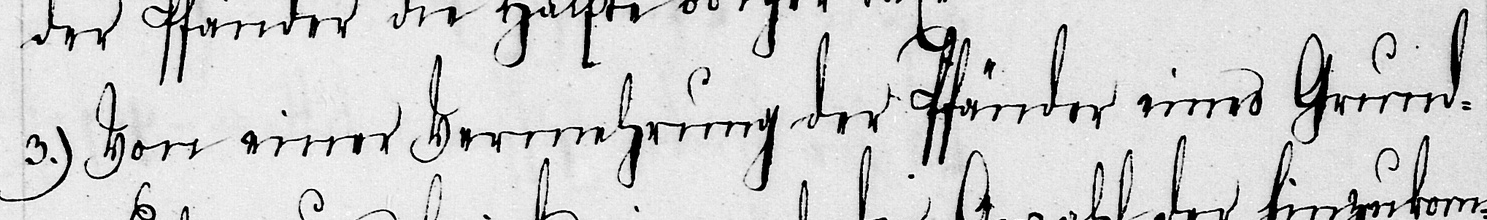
3.) Von einer Vermehrung der Pfänder eines Grund¬
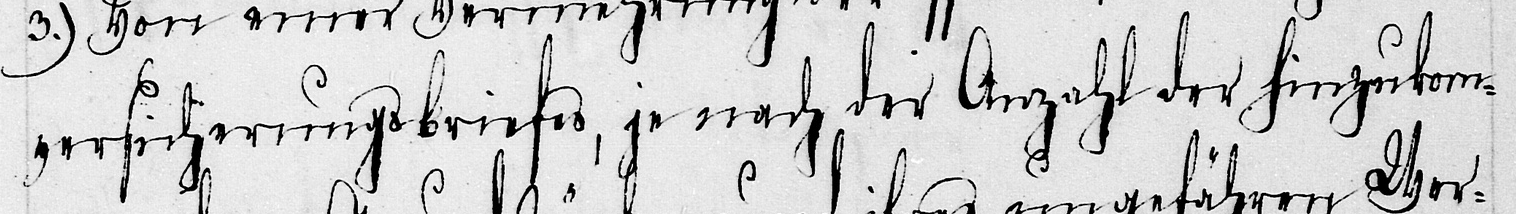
versicherungsbriefes, je nach der Anzahl der hinzukom¬
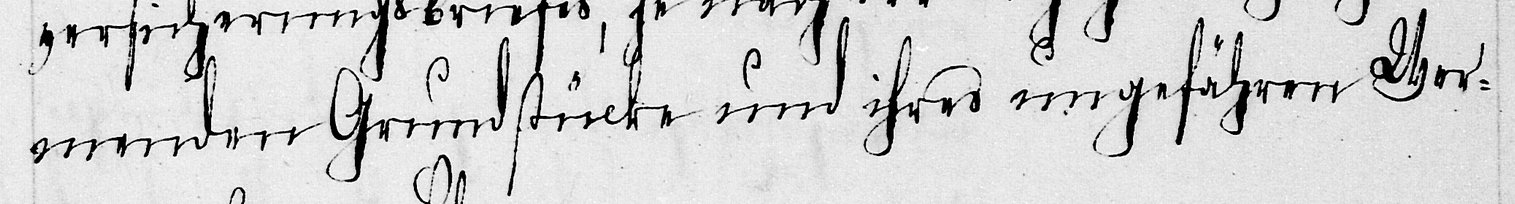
menden Grundstücke und ihres ungefähren Wer¬
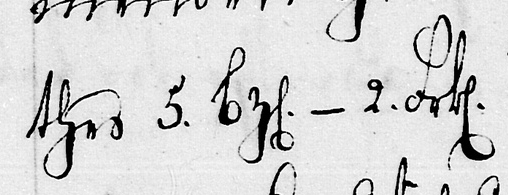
thes 5. Bz[en]. – 2.
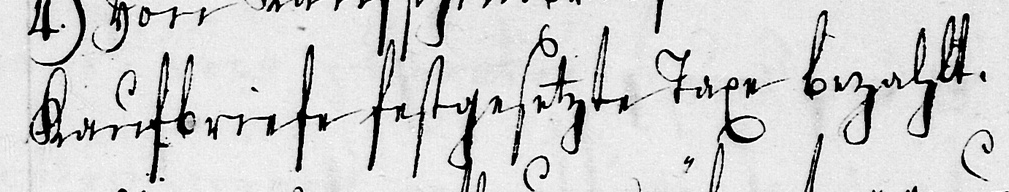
Kaufbriefe festgesetzte Taxe bezahlt.
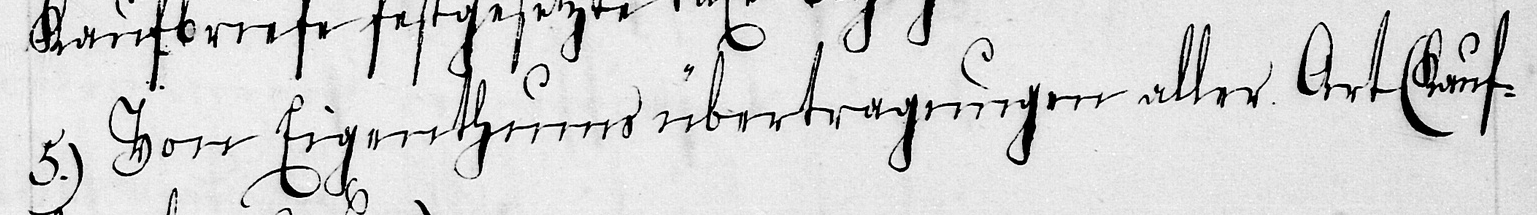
5.) Von Eigenthumsübertragungen aller Art (Kauf¬
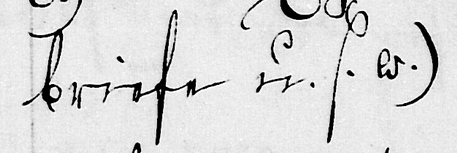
briefe u. s. w.)
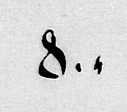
8.
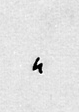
4.
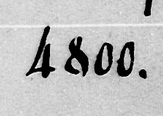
4800.
